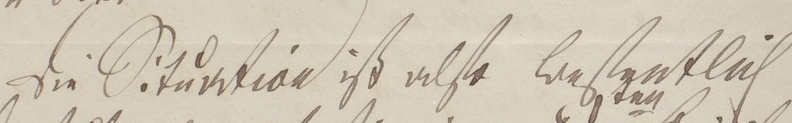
Die Situation ist also wesentlich
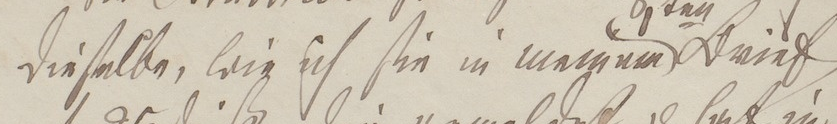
dieselbe, wie ich sie in meinem 1ten Brief
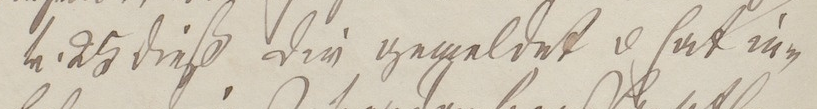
v. 25 dieß Dir gemeldet & hat in-
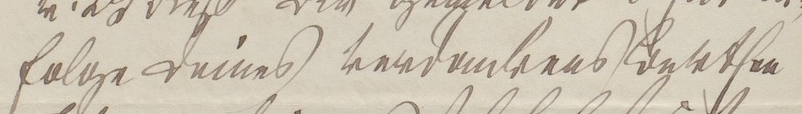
folge Deines verdankenswerthen
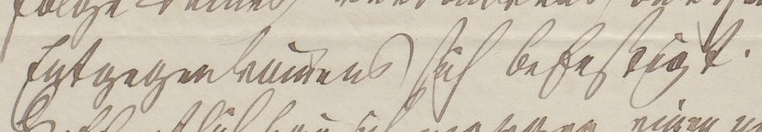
Entgegenkommens sich befestigt.
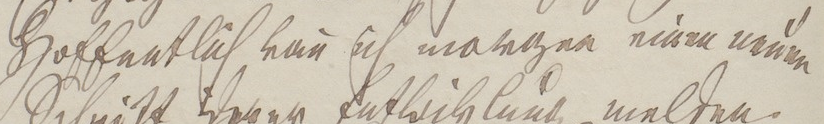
Hoffentlich kann ich morgen einen neuen
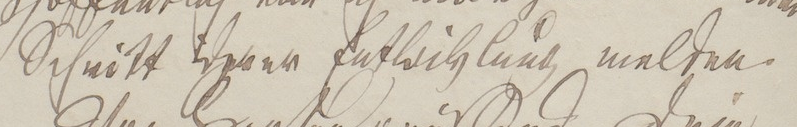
Schritt ihrer Entwicklung melden.
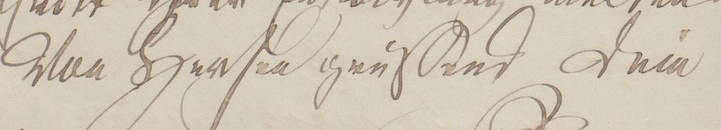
Von Herzen grüssend Dein
